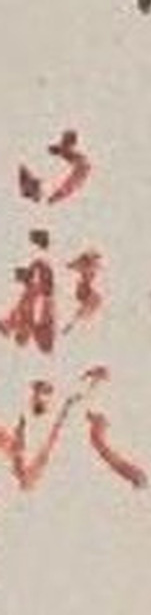御船頭
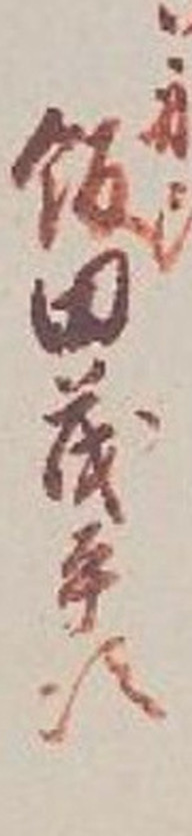飯田茂平次

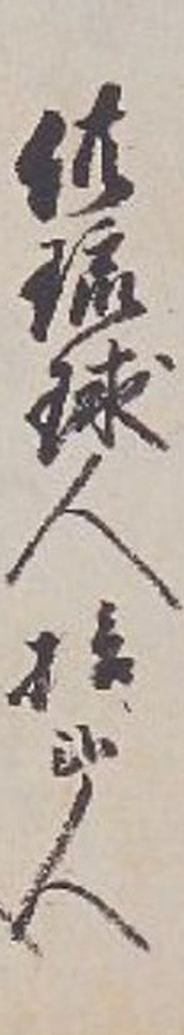供琉球人拾弐人
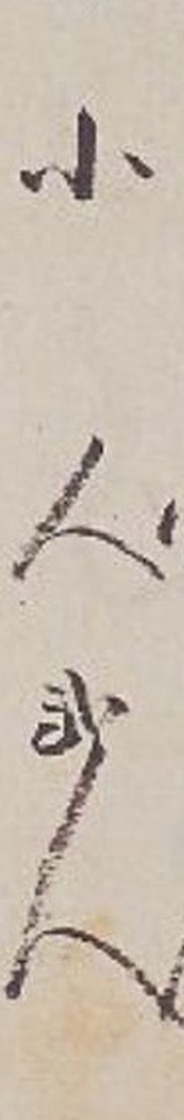小人弐人
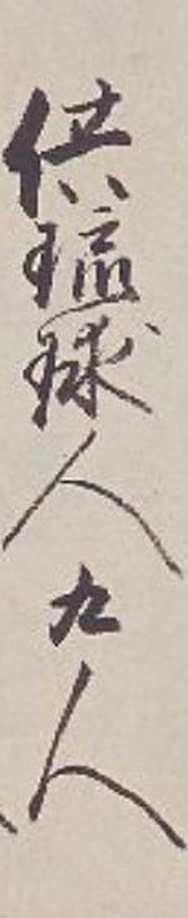供琉球人九人
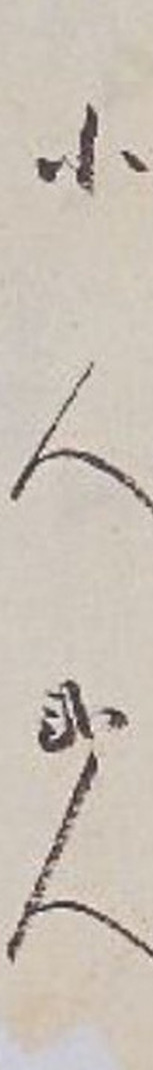小人弐人

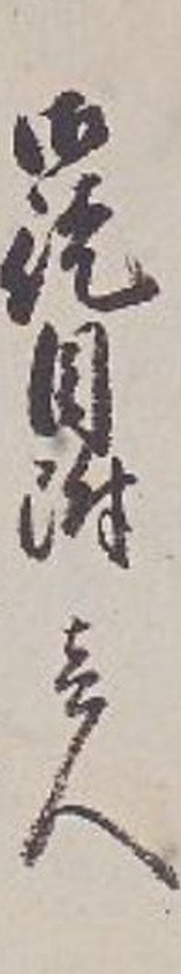御徒目付壱人
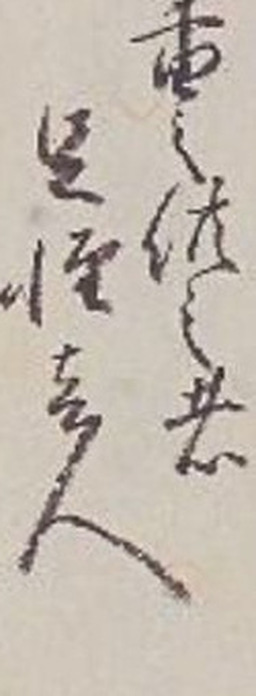足軽壱人
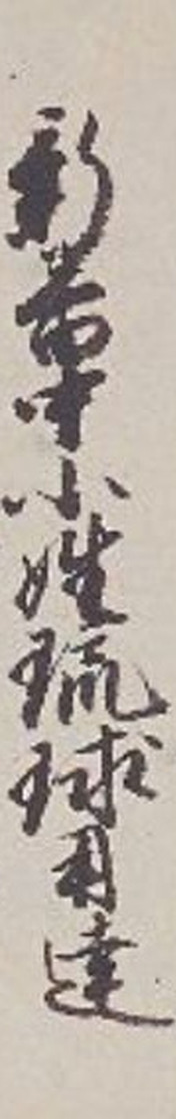新番中小姓琉球用達
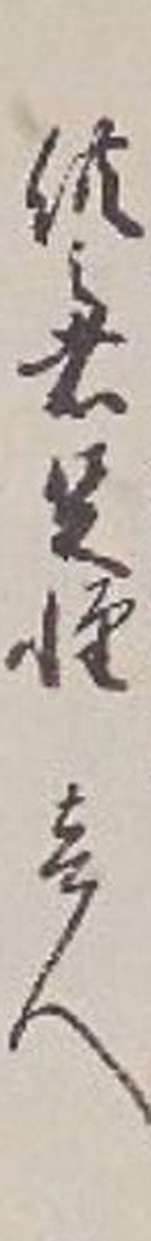供之者足軽壱人
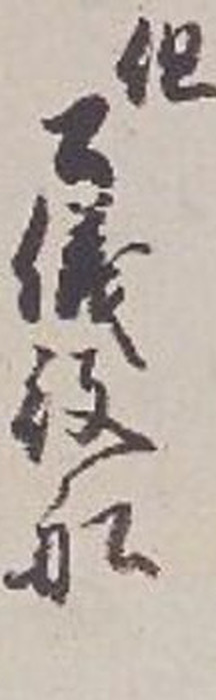公儀役船
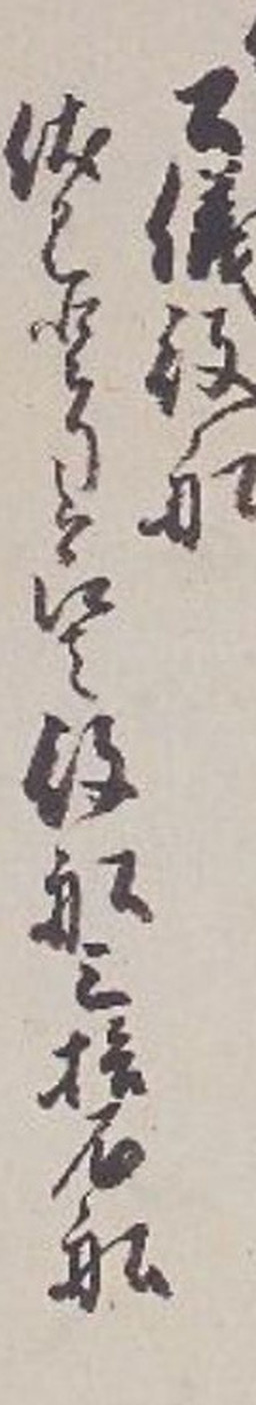伏見登り之節は役船三拾石船

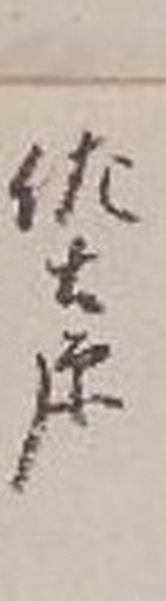佐土原
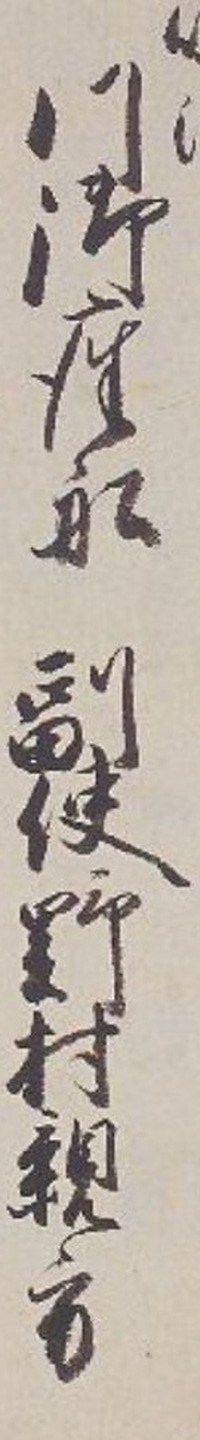川御座船副使野村親方
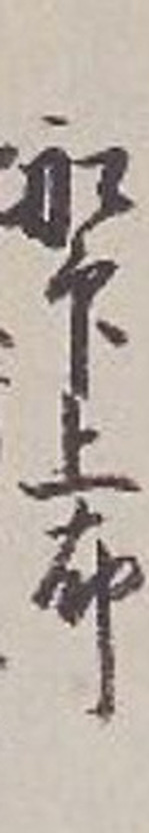船印上布
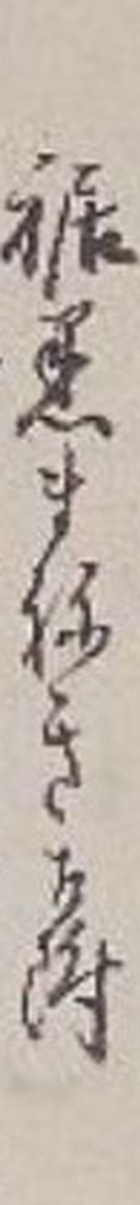裾黒まねき召付
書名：琉球人就来府淀川筋船行列帳 但木津川より大阪御屋敷迄並其外一巻
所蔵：University of the Ryukyus Library
